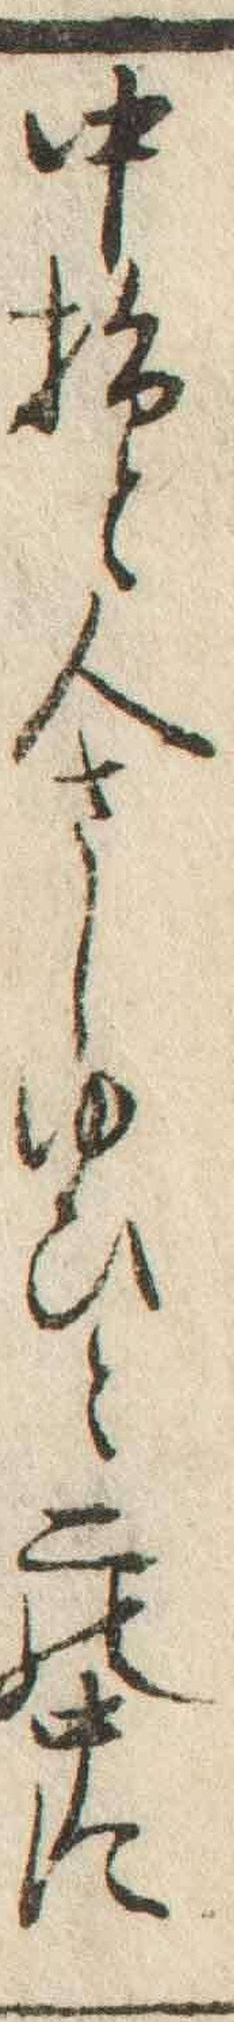中指と人さしゆひとこの中に
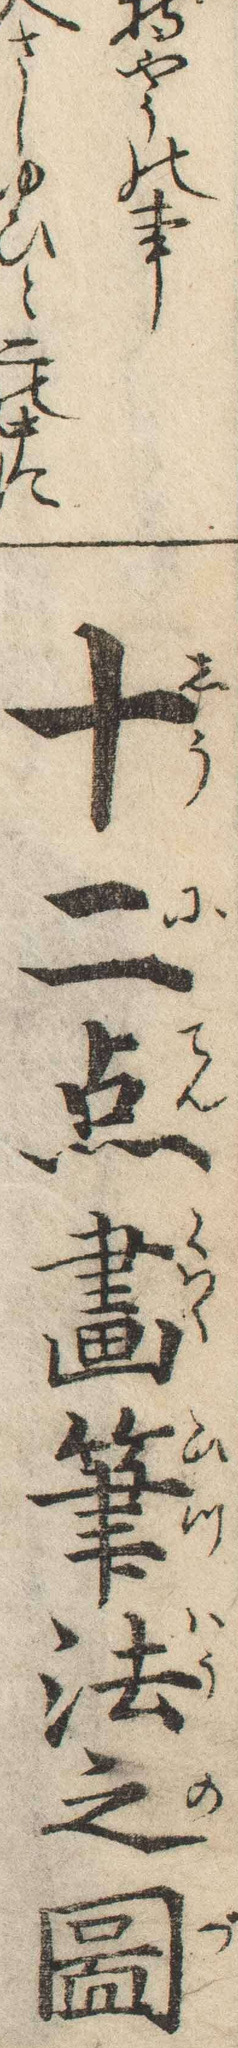十二点画筆法之図
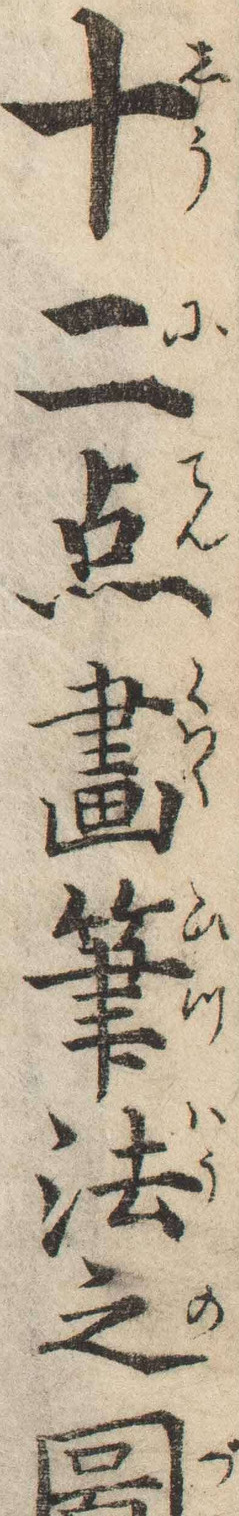十二点画筆法之図
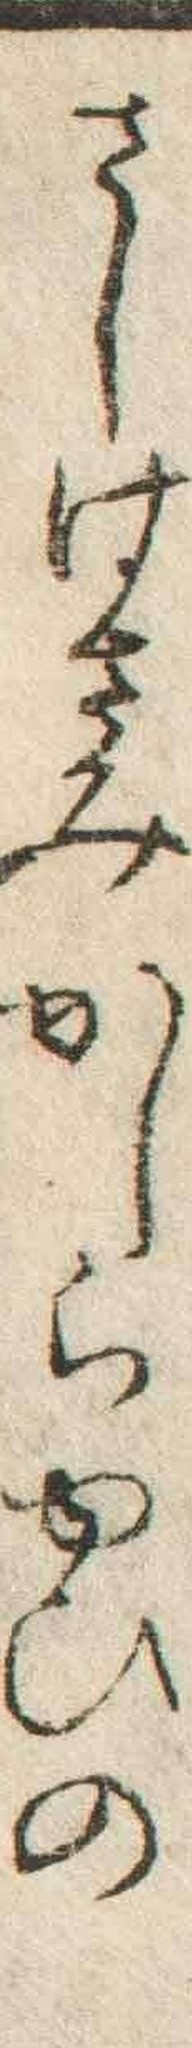さしはさみかしらゆひの
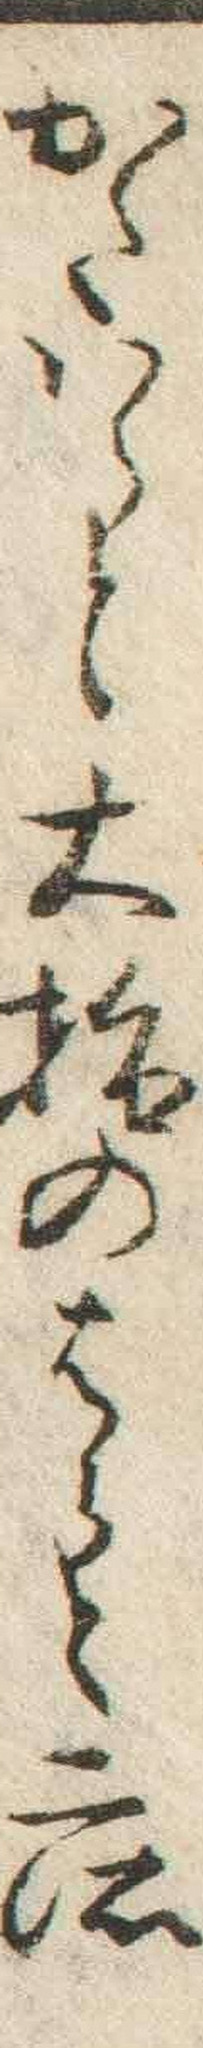かたはらと大指のはらと二所
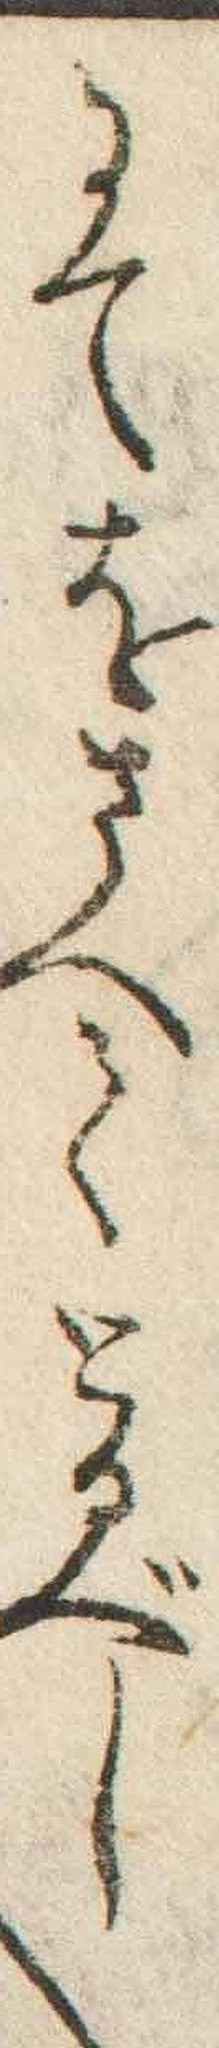にてをさへてとるべし
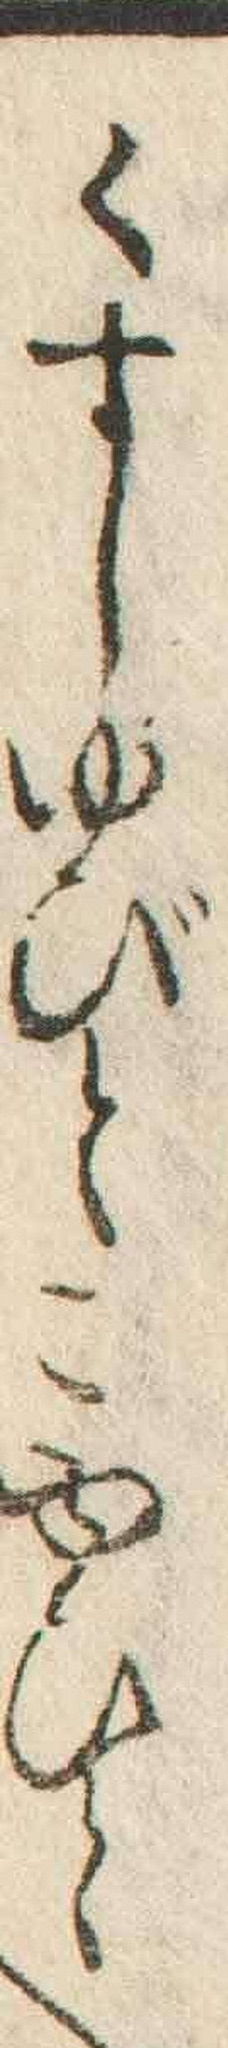くすしゆびとこゆひと
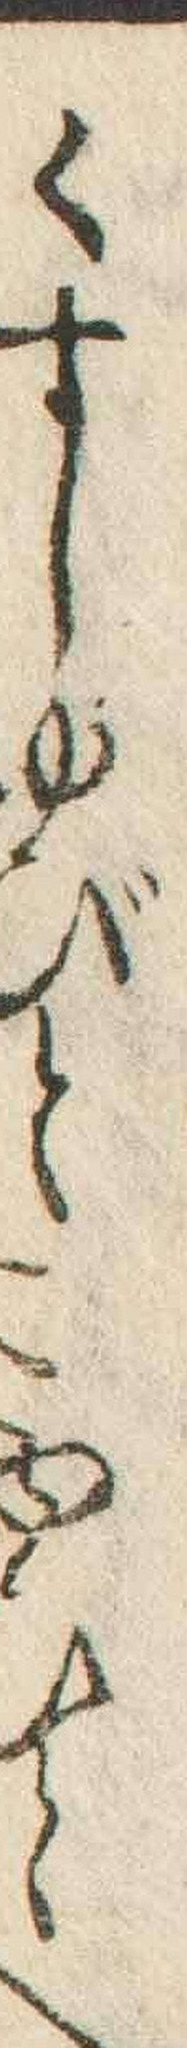くすしゆびとこゆひと
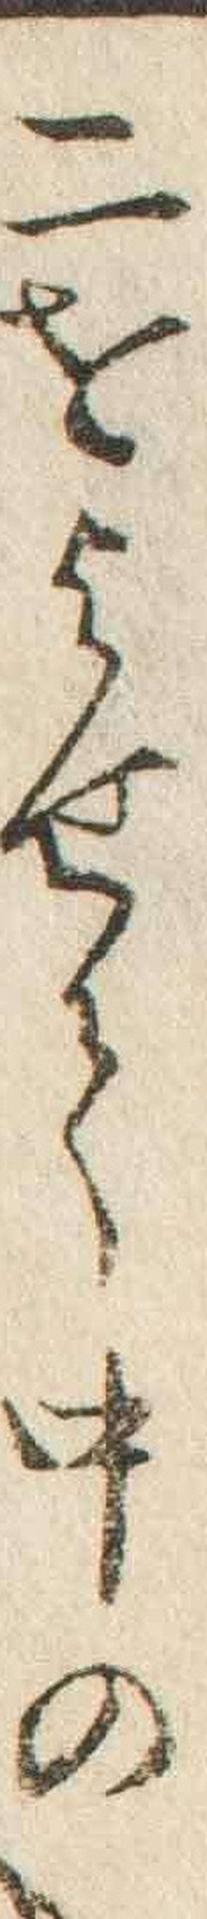二をよせて中の
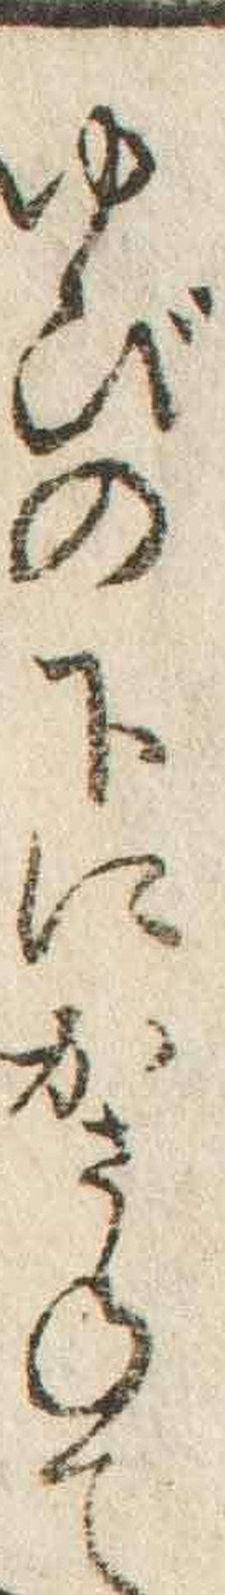ゆびの下にかさねて
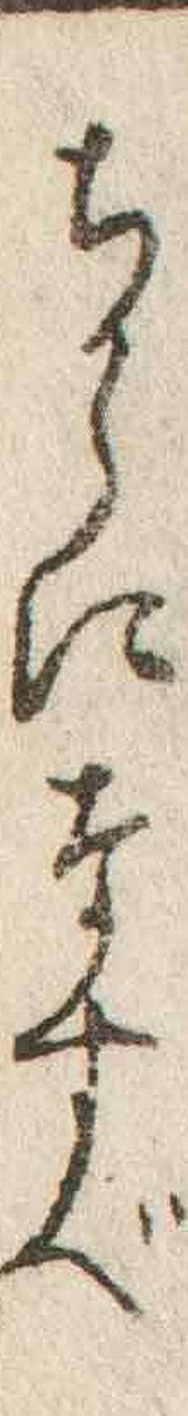ちからになすべし
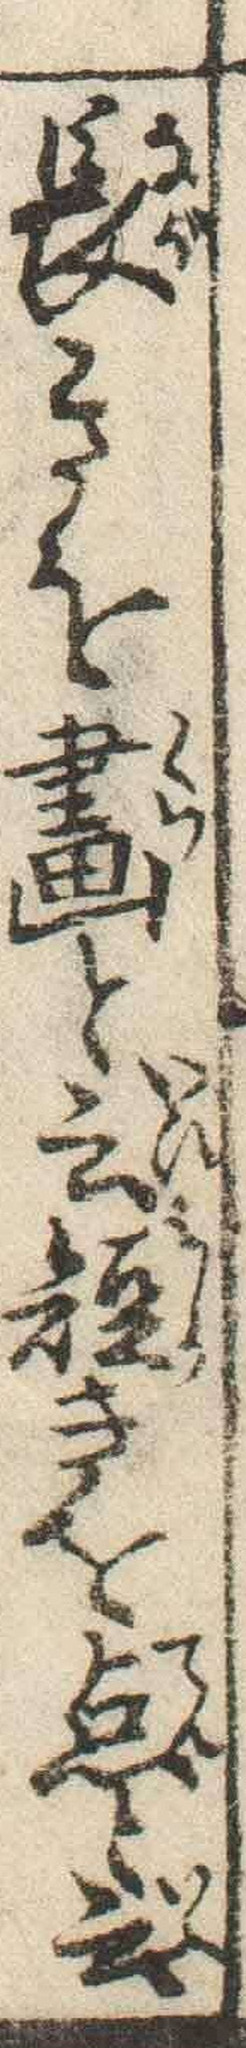長きを画と云短きを点と云
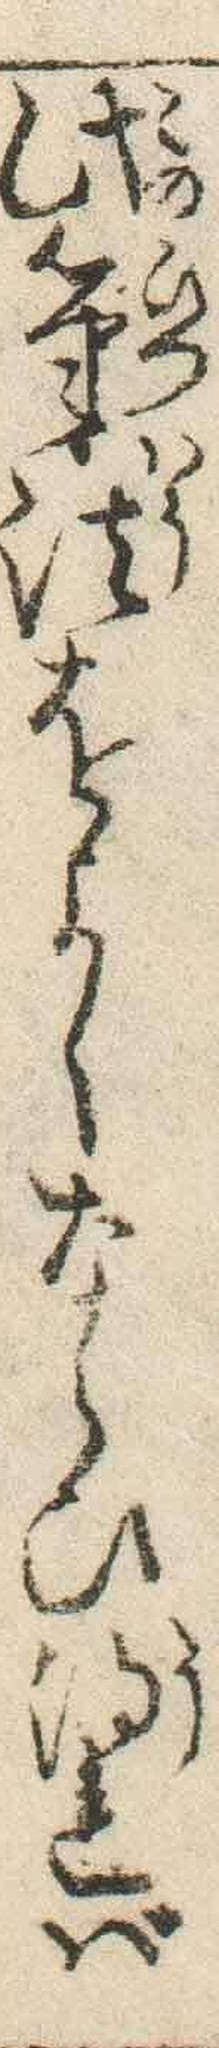此筆法をよくならひ得れば
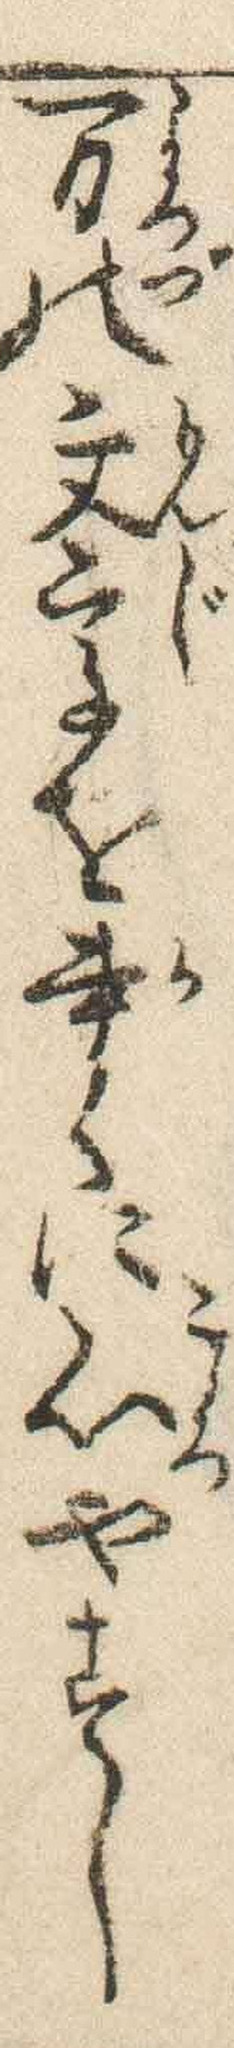万の文字を書くに心やすし
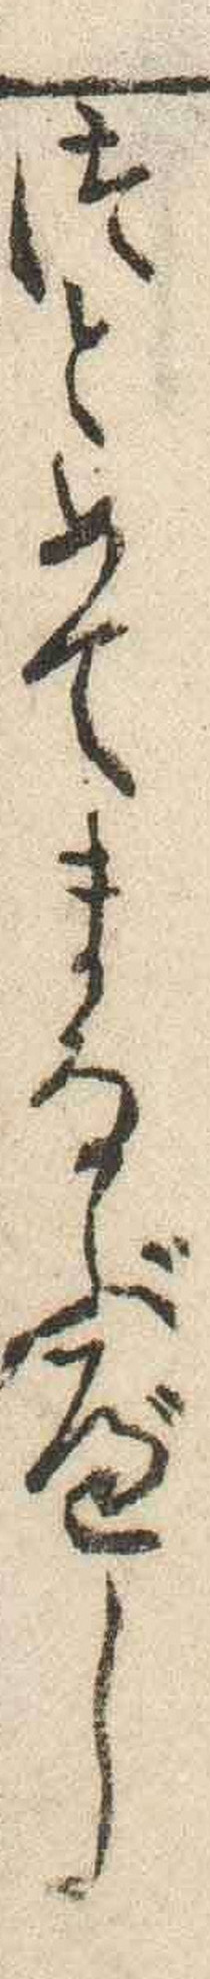つとめてまなぶべし
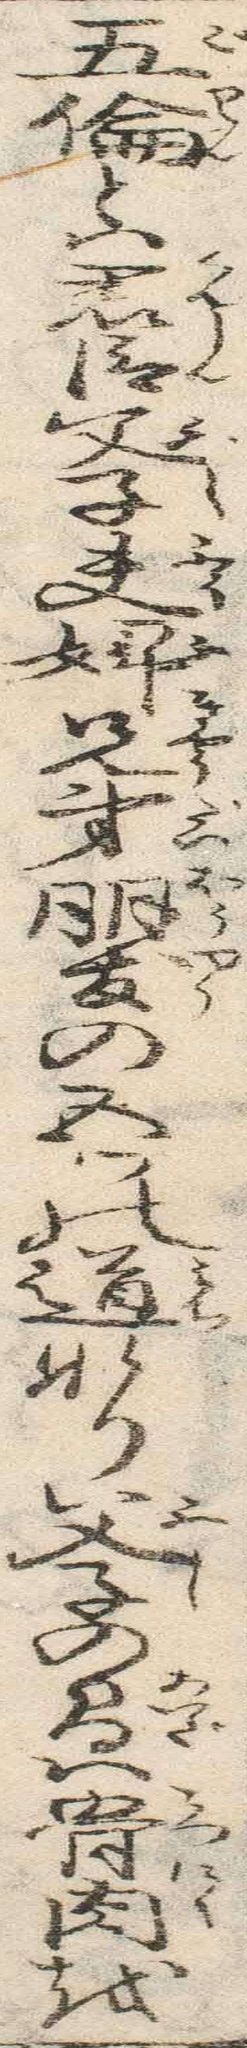五倫とは君臣父子夫婦兄弟朋友の御五ッの道なり父子の間は骨肉を
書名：撫育草
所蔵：東京学芸大学附属図書館 国文学研究資料館
